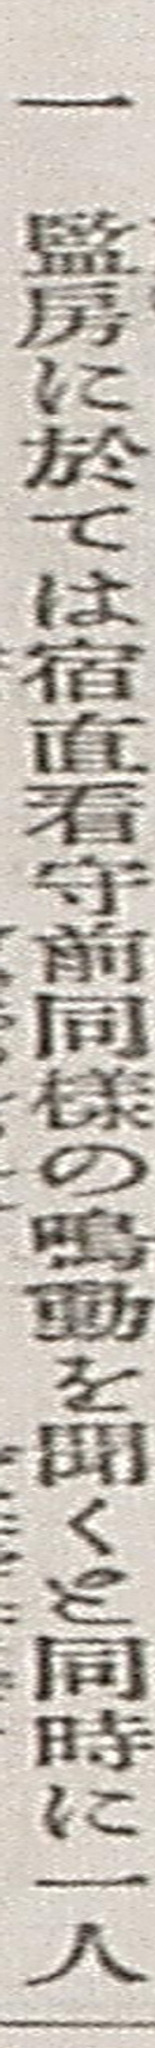一監房に於ては宿直看守前同様の鳴動を聞くと同時に一人
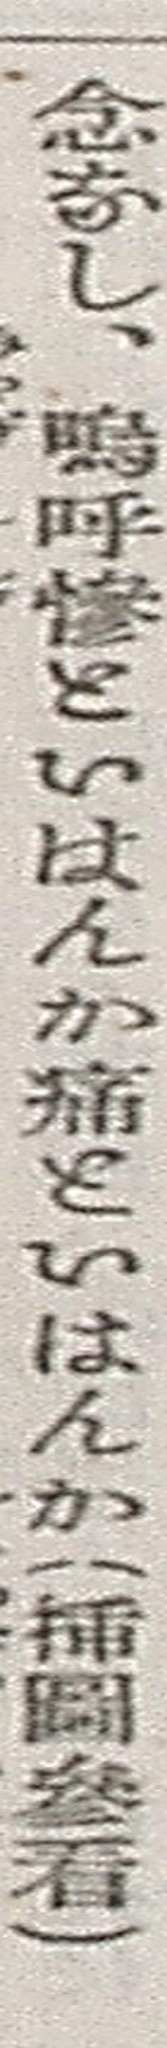念なし、嗚呼惨といはんか痛といはんか
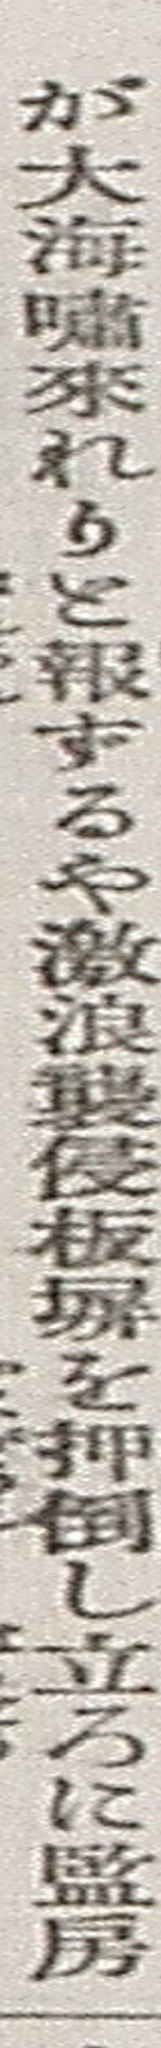が大海嘯来れりと報ずるや激浪襲侵板塀を押倒し立ろに監房
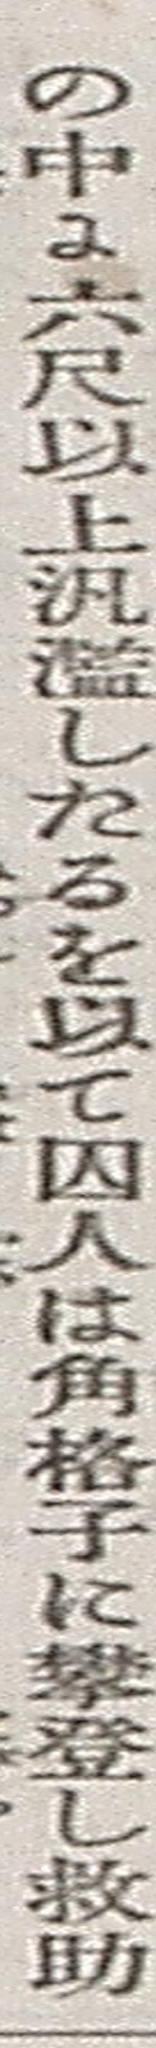の中に六尺以上汎濫したるを以て囚人は角格子に攣登し救助
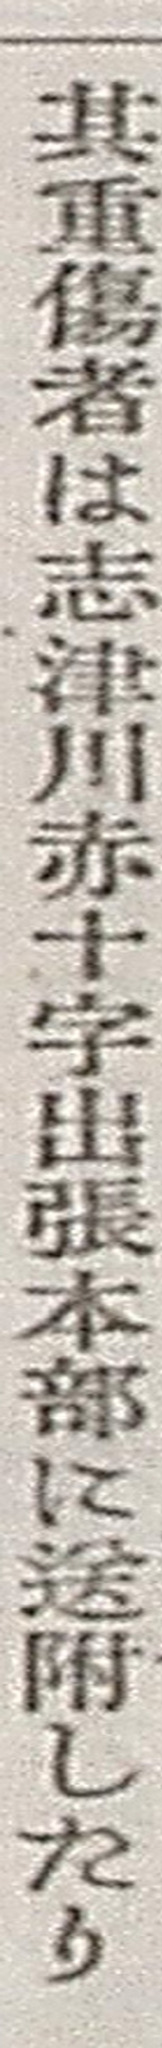其重症者は志津川赤十字出張本部に送付したり
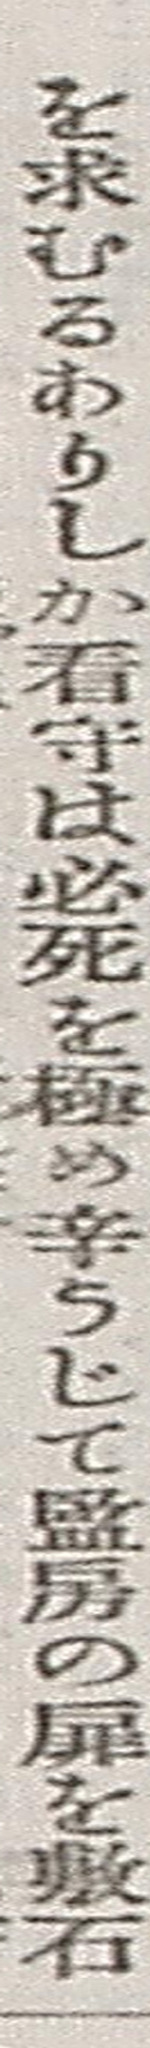を求むるありしか看守は必死を極め辛うじて監房の扉を敷石
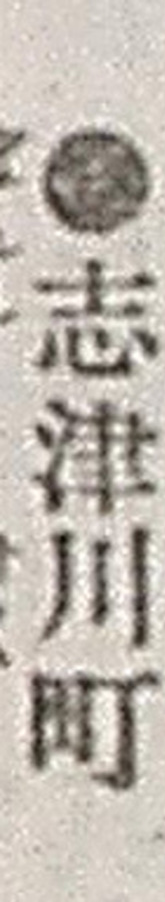●志津川町
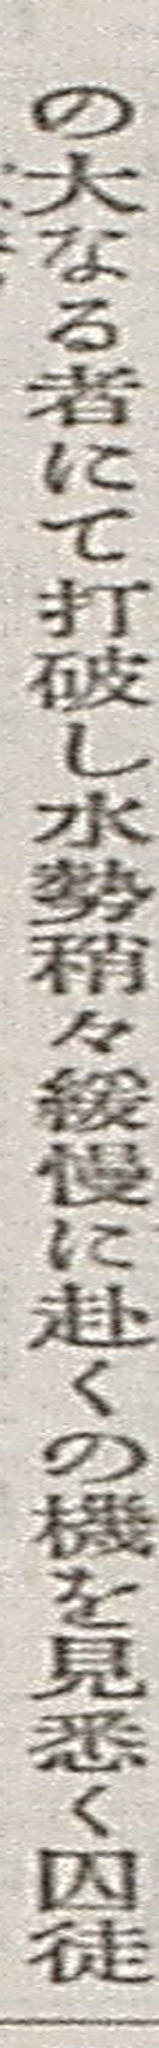の大なる者にて打破し水勢稍々緩慢に赴くの機を見悉く囚徒
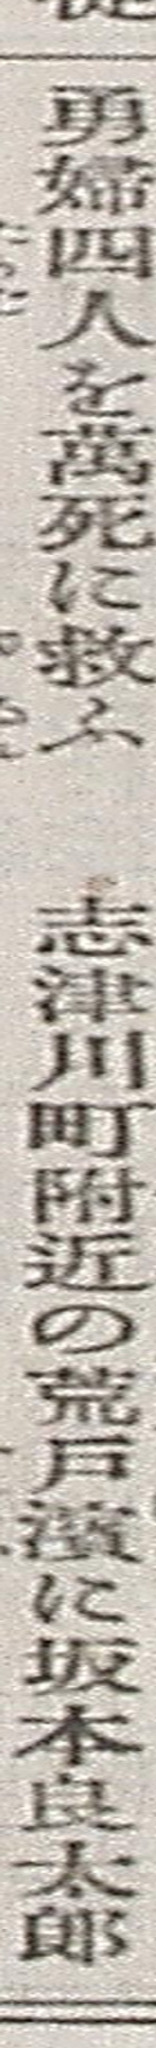勇婦四人を万死に救ふ志津川町付近の荒戸浜に坂本良太郎
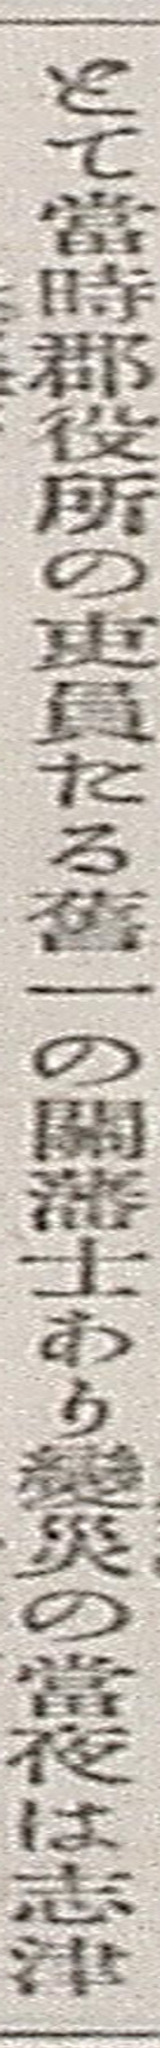とて当時郡役所の吏員たる旧一の関藩士あり変災の当夜は志津
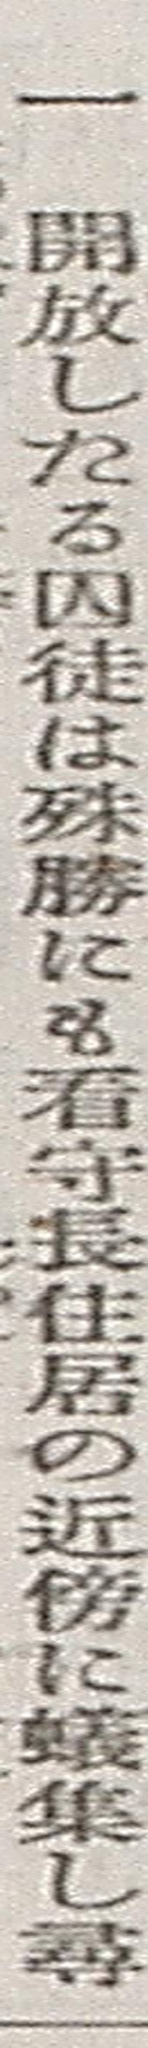一開放したる囚徒は殊勝にも看守長住居の近傍に蟻集し尋
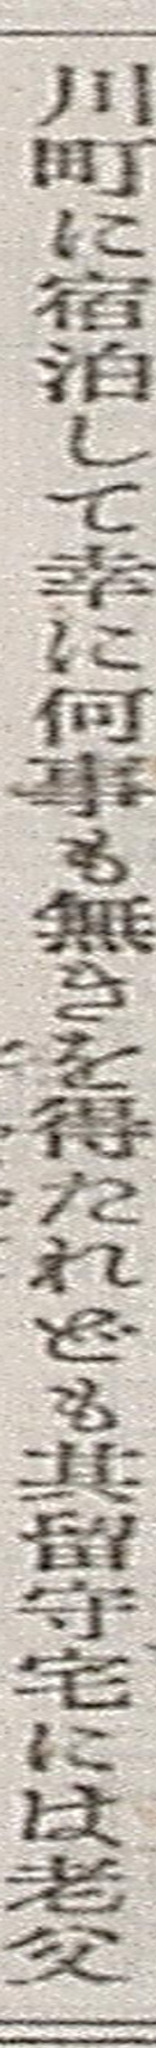川町に宿泊して幸に何事も無きを得たれども其留守宅には老父
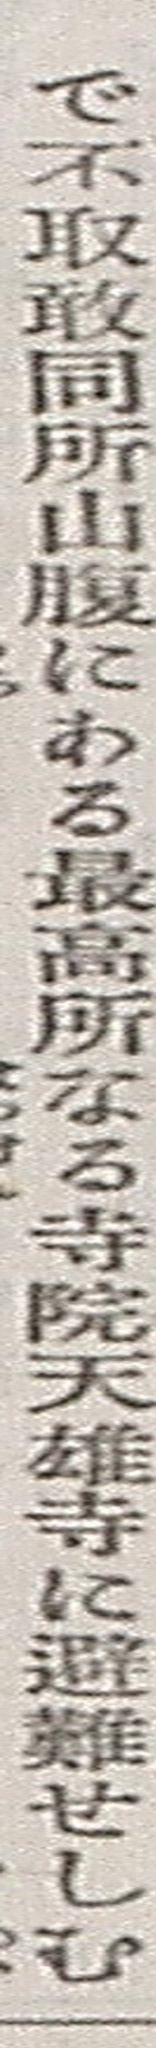で不取敢同所山腹にある最高所なる寺院天雄寺に避難せしむ
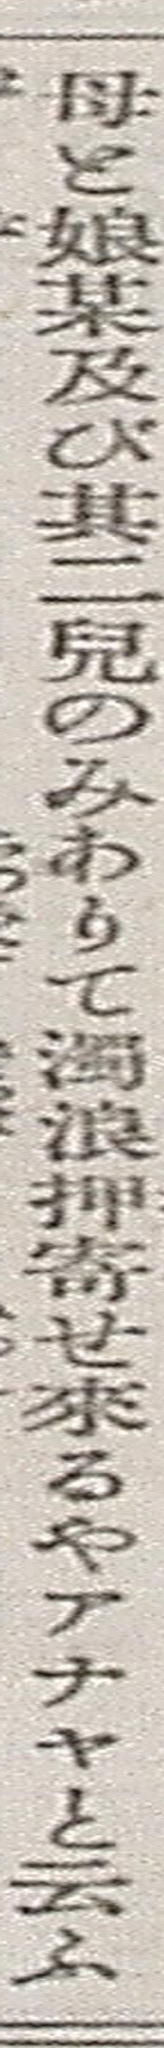母と娘某及び其二児のみありて濁浪押寄せ来るやアナャと云ふ
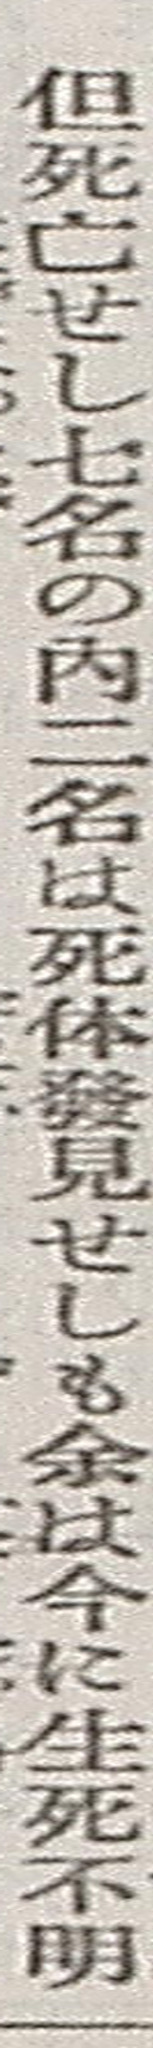但死亡せし七名の内二名は死体発見せしも余は今に生死不明
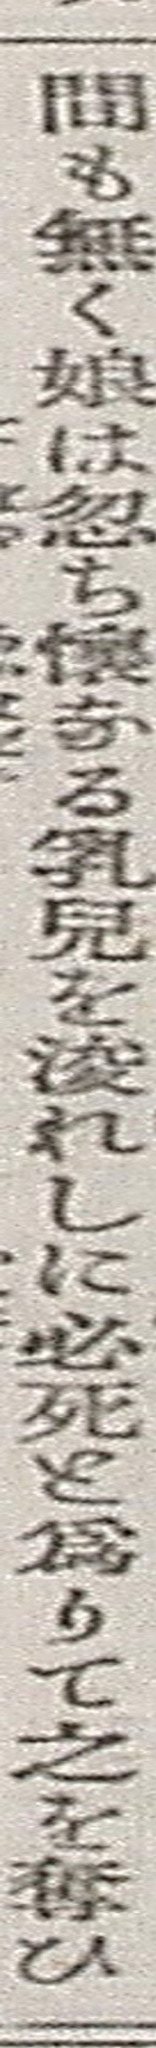間も無く娘は忽ち懐なる乳児を浚れしに必死と為りて之を奪ひ
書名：風俗畫報臨時増刊第百十九號　大海嘯被害録（中）
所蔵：東京大学地震研究所図書室 Earthquake Research Institute Library, The University of Tokyo, JAPAN
